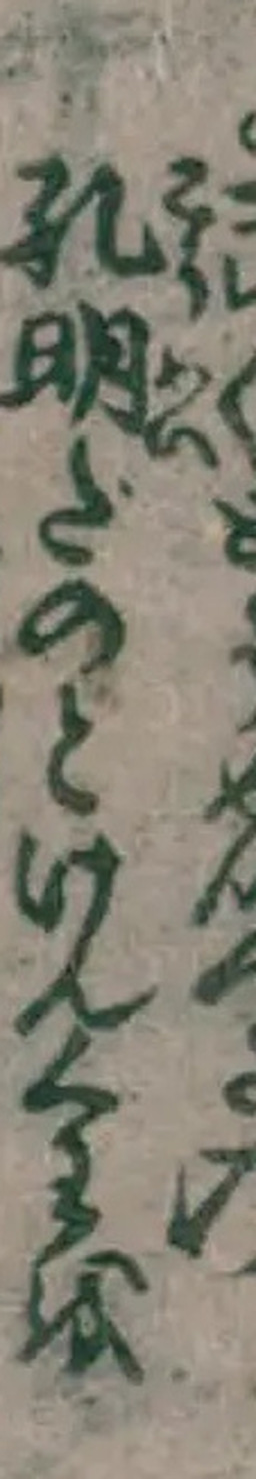孔明たのとけんくわを
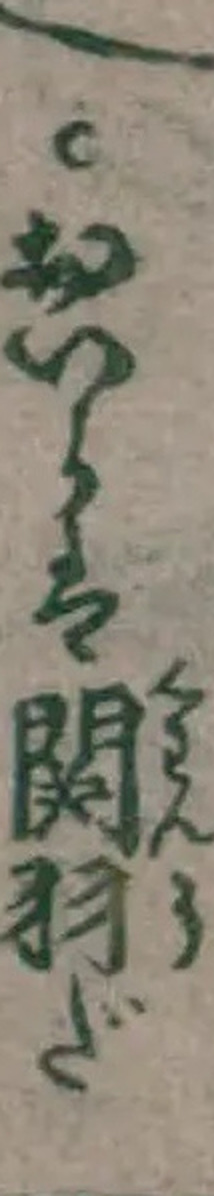○おいらは関羽だ
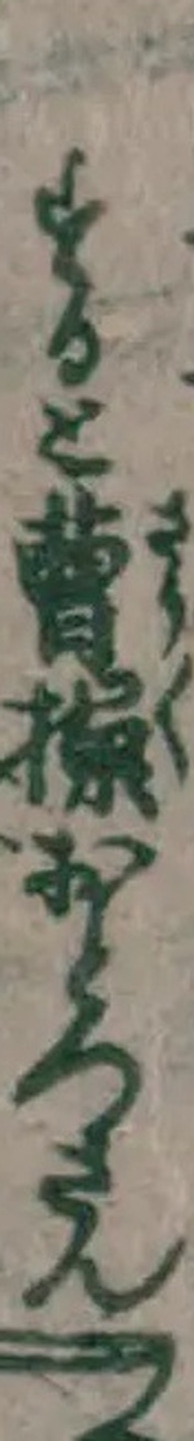すると曹操おとつさん
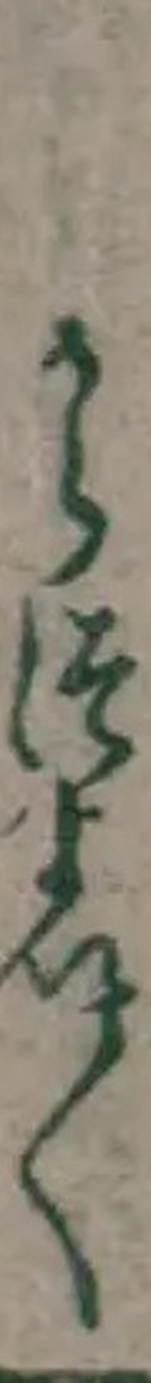からつよい〳〵
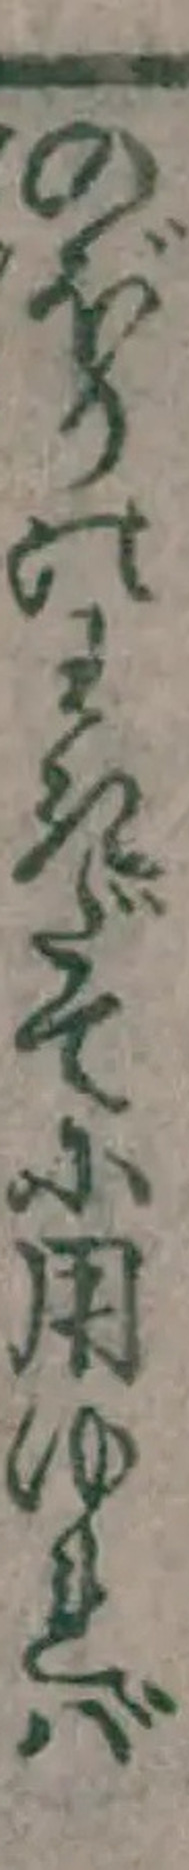のぼりのわきだてに用ゆれば
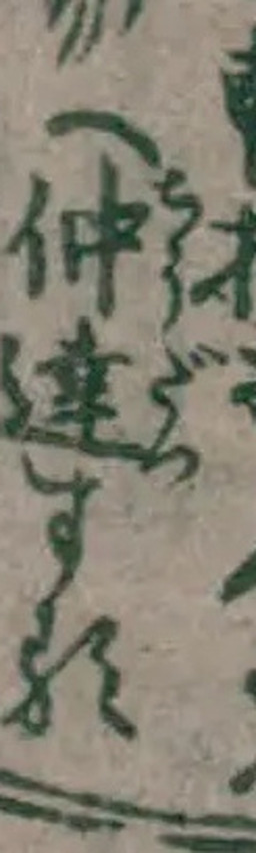へ仲達する
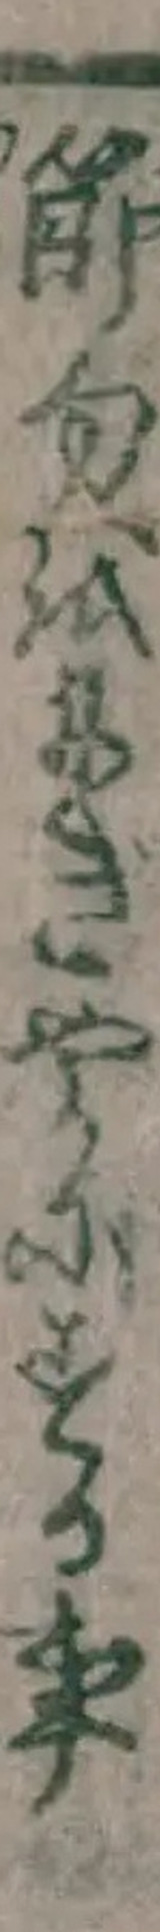節句をにぎやかにする事
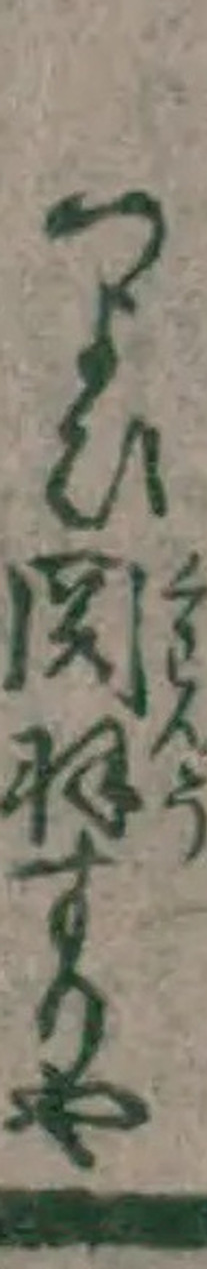つよひ関羽すりや
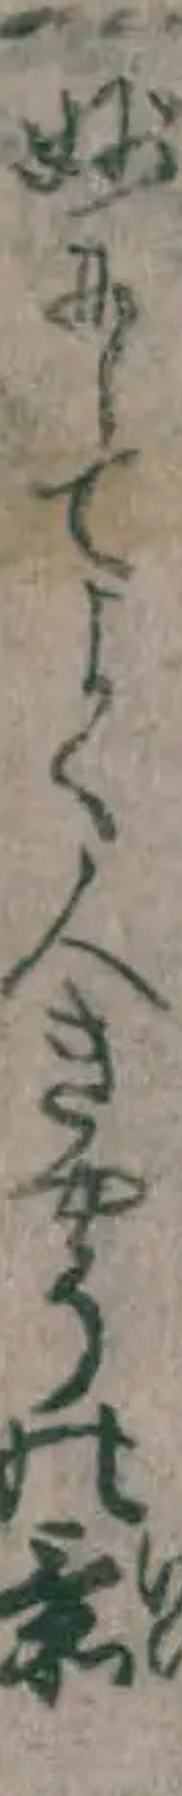妙にしてよく人きやうの景
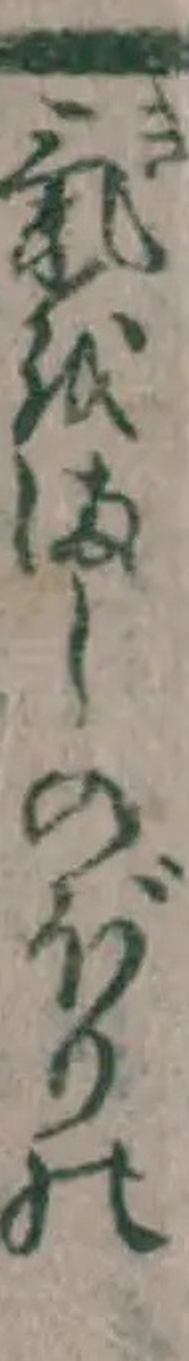気満しのぼりの
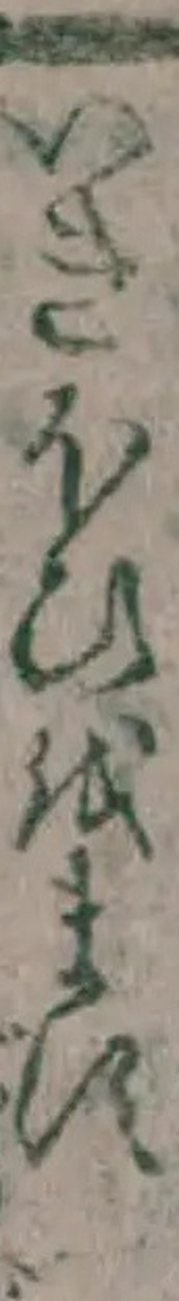いきほひをます
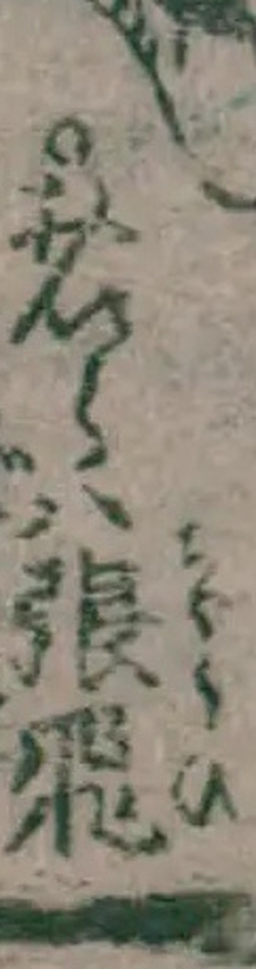○おいらは張飛
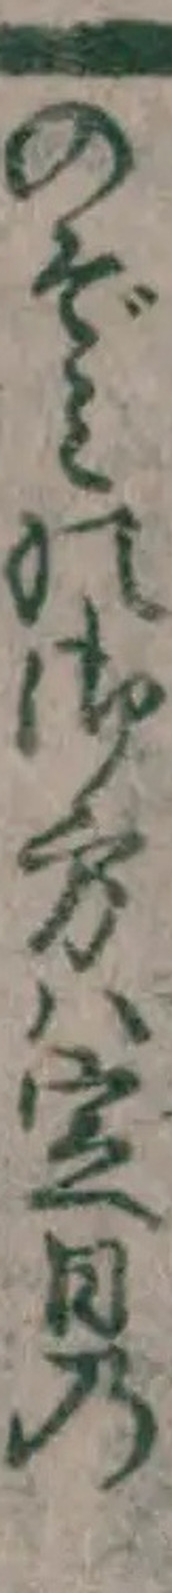のぞみの御方は定日の
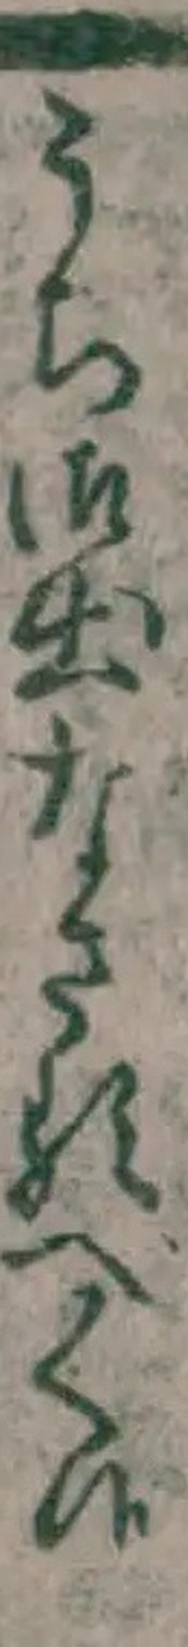うち御出なさるへく候
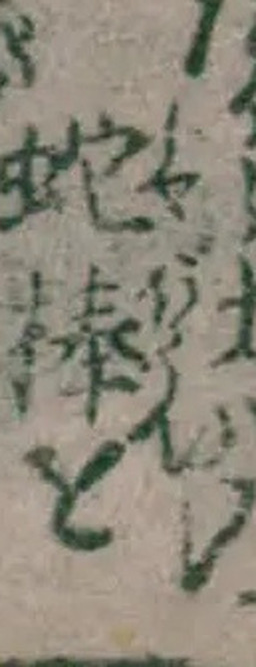蛇棒を
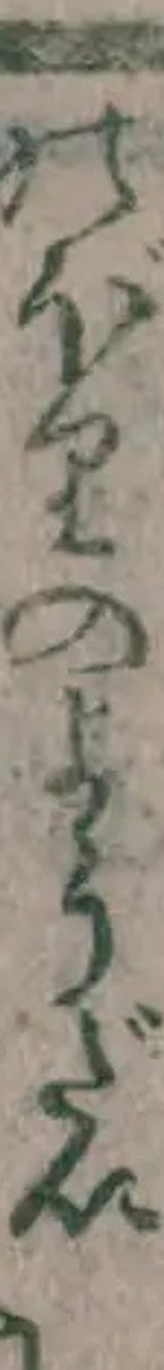のぼりのようだい
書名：視薬霞報条 3巻
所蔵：国立国会図書館 National Diet Library, JAPAN
